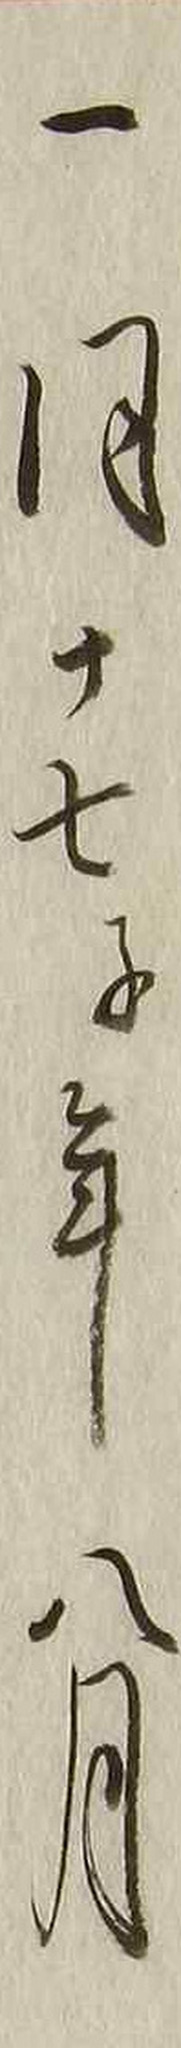一同十七子年八月
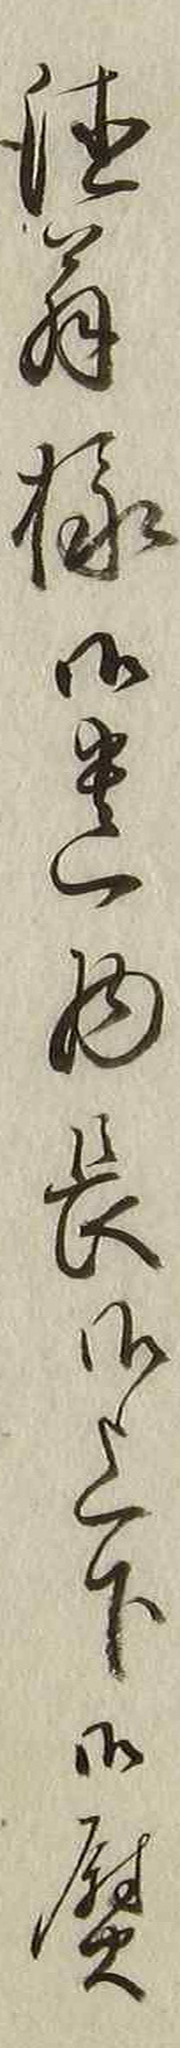徳翁様御遺物長御上下御熨
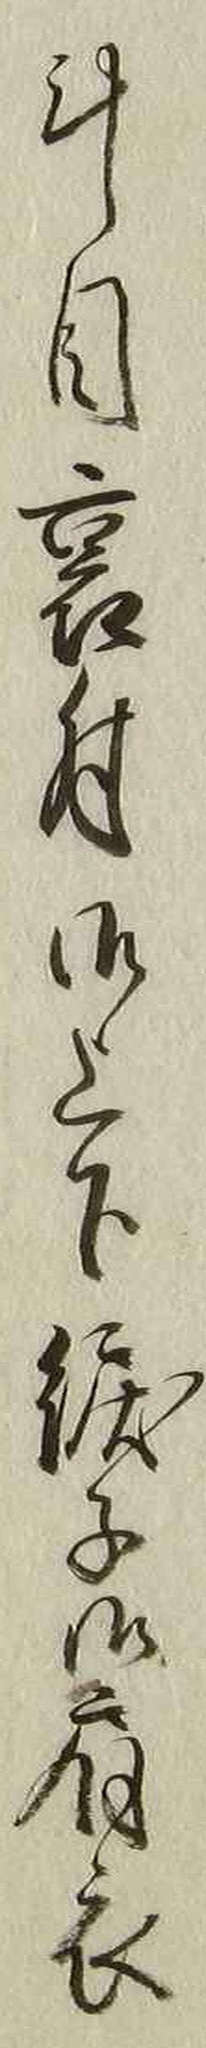斗目裏付御上下綟子肩衣
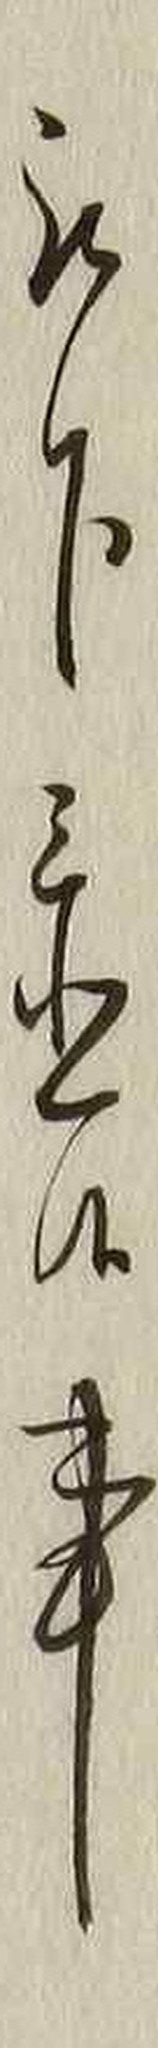被下置候事
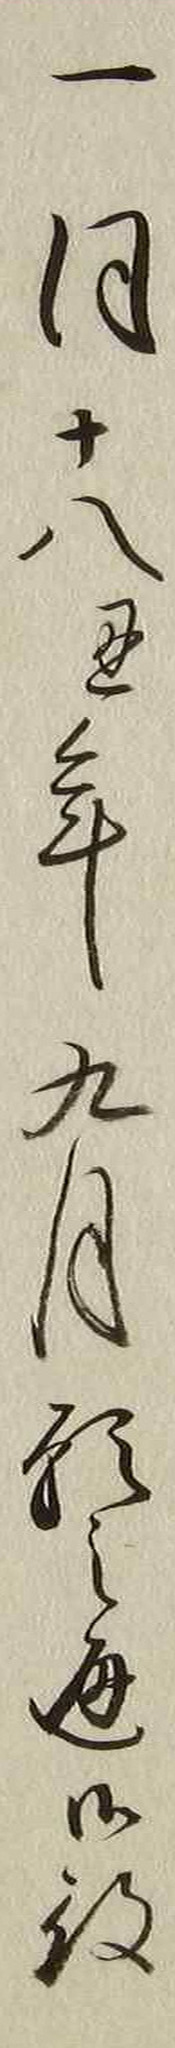一同十八丑年九月願之通御役
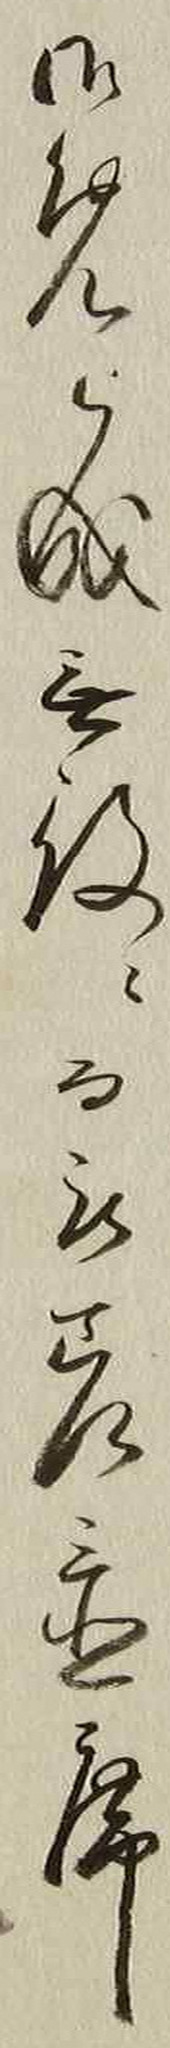御免被成無役ニ而被差置席
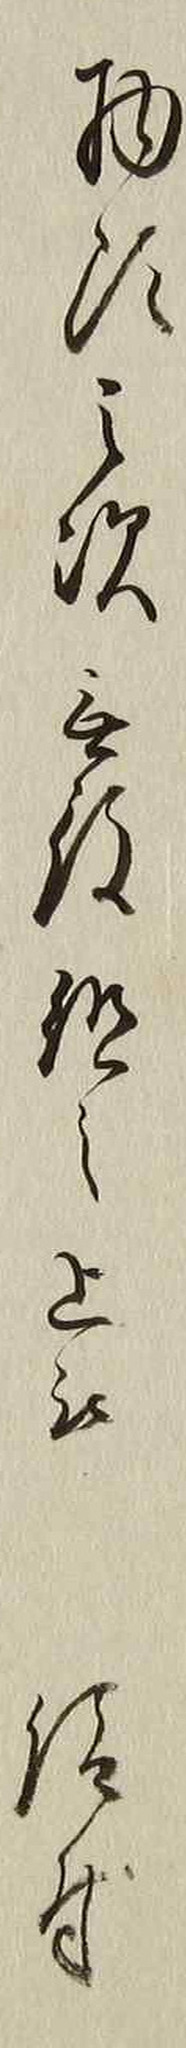物頭之次無役組之上被
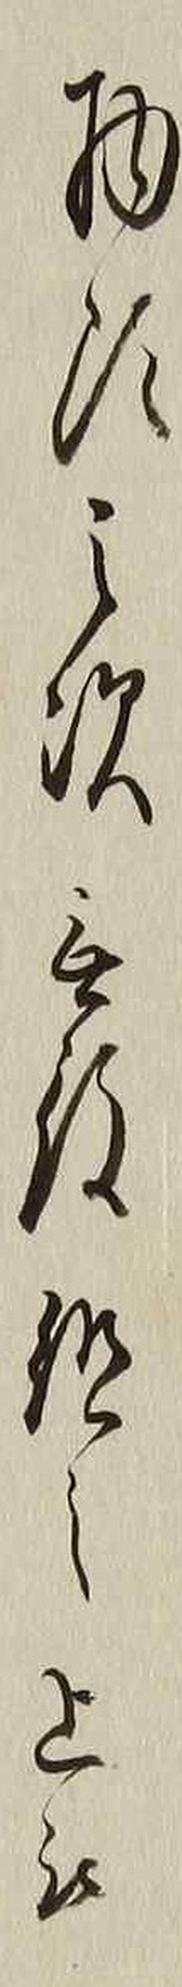物頭之次無役組之上被
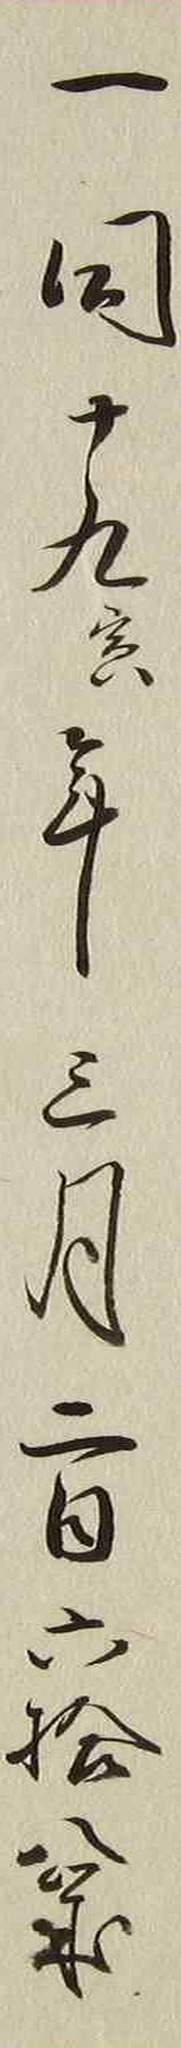一同十九寅年三月二日六拾八歳
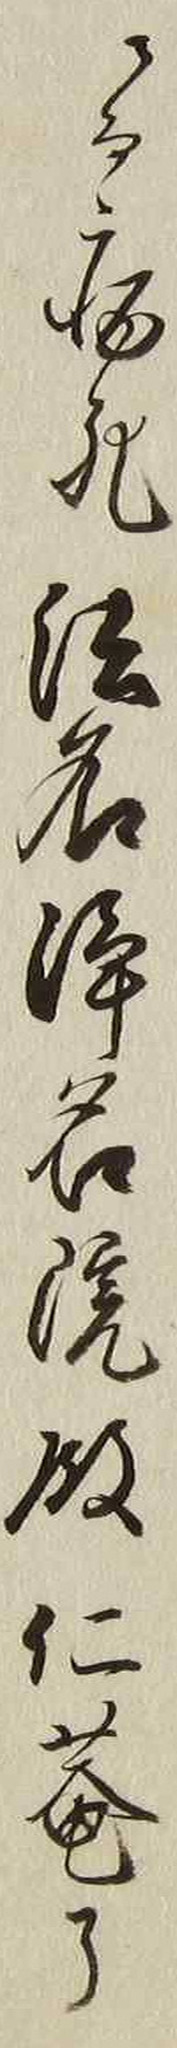ニ而病死法名浄名院殿仁菴了
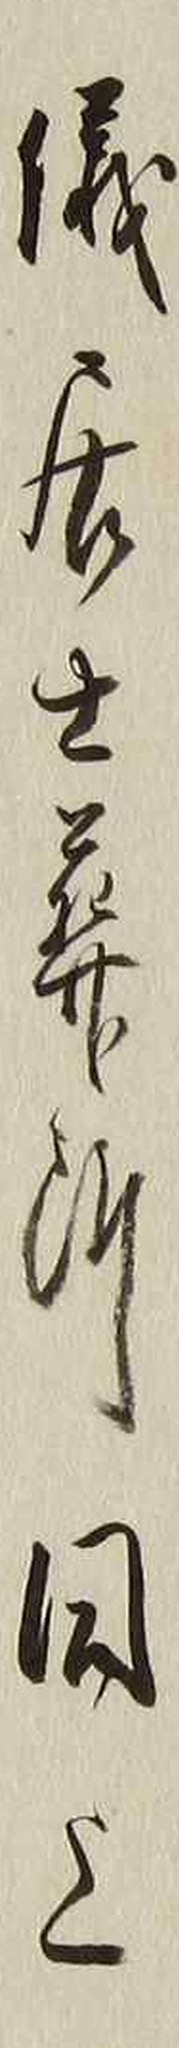儀居士葬所同上
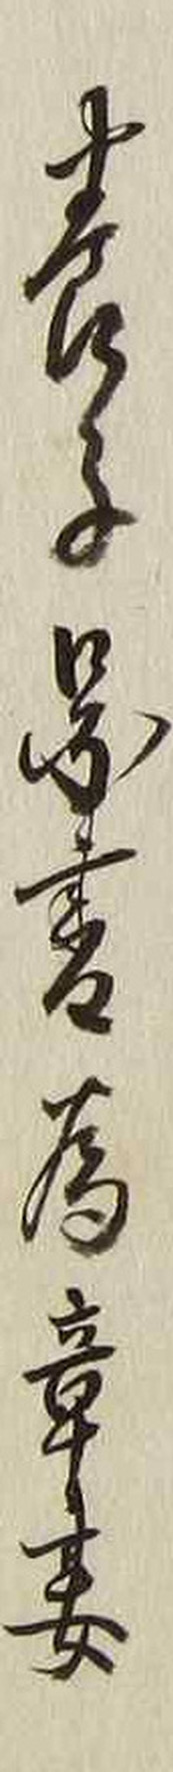女養子図書為章妻
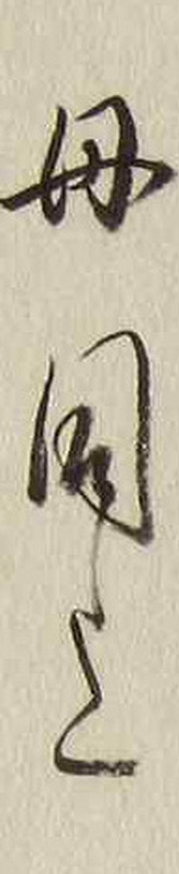母同上

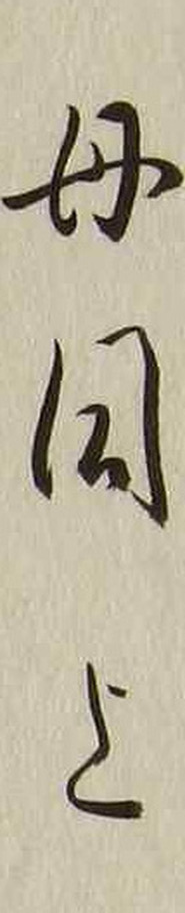母同上
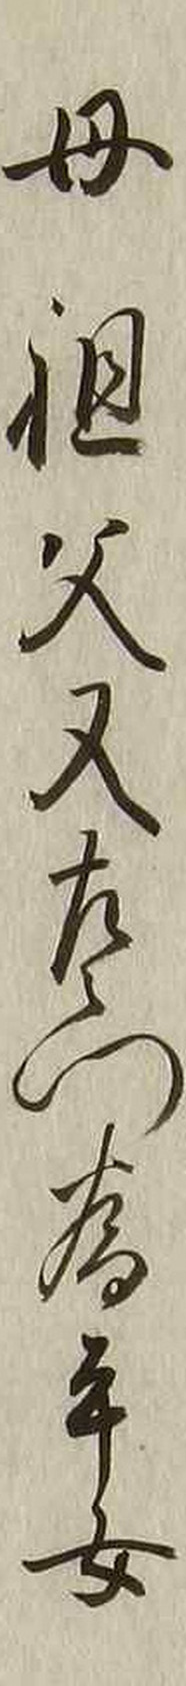母祖父又左衛門為平女
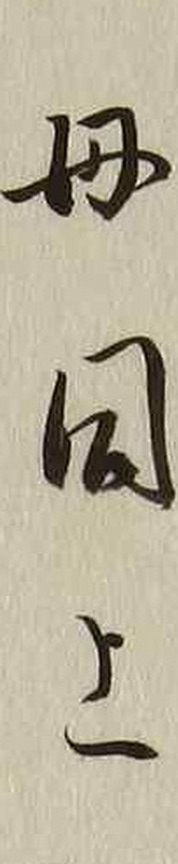母同上
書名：諸士系譜　巻之18　い之部18
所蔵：会津若松市立会津図書館
